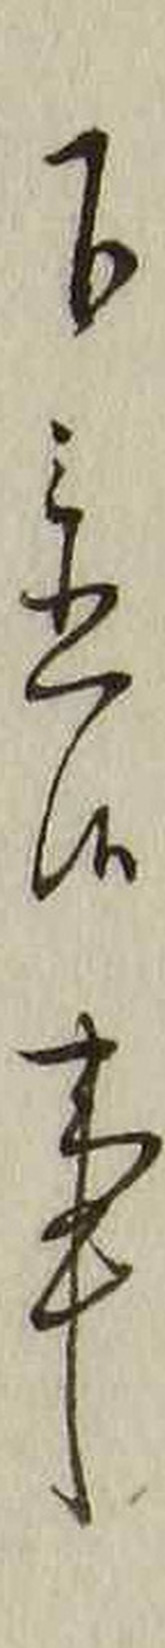下置候事
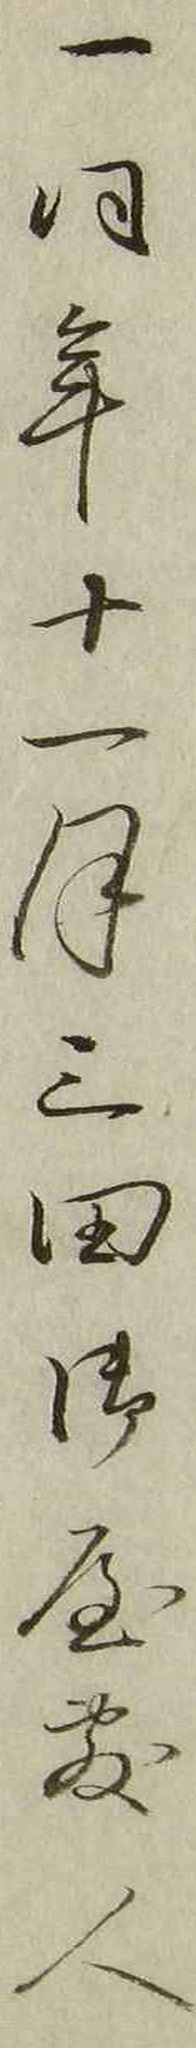一同年十一月三田御屋敷人
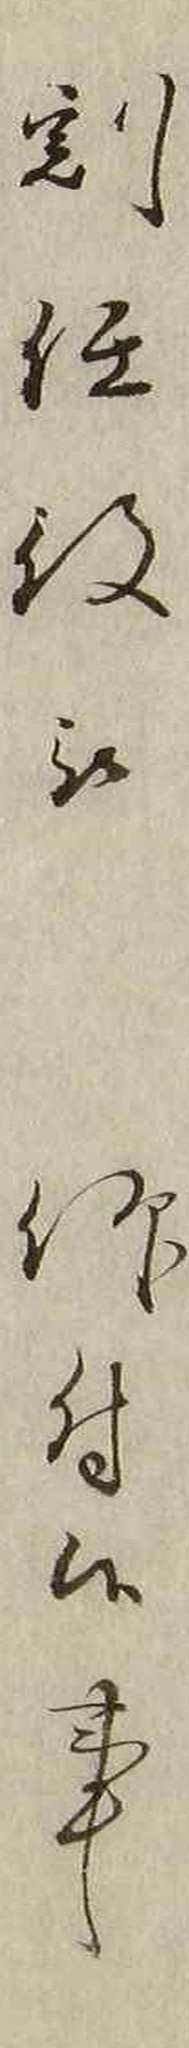割任役被仰付候事
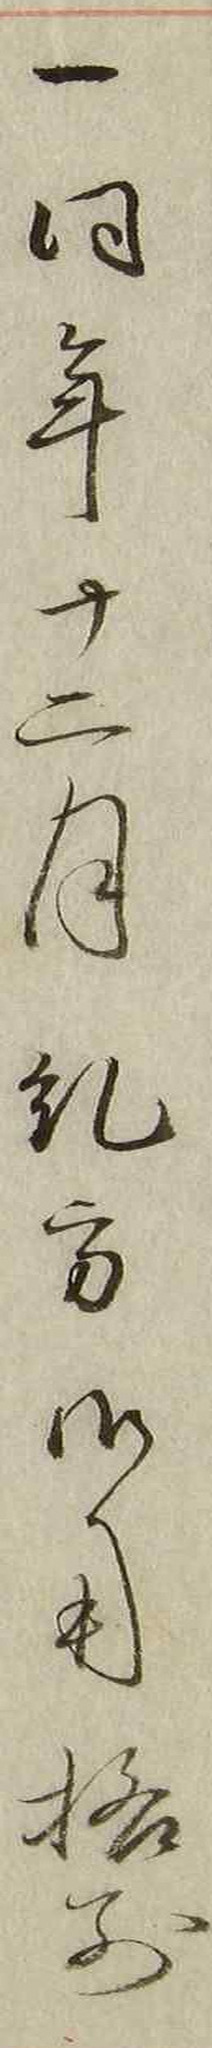一同年十二月糺方御用格別
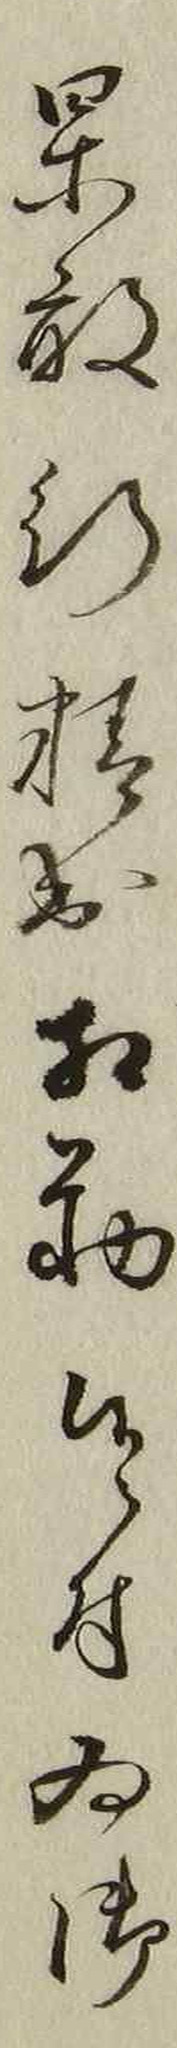果敢行精出相勤候ニ付為御
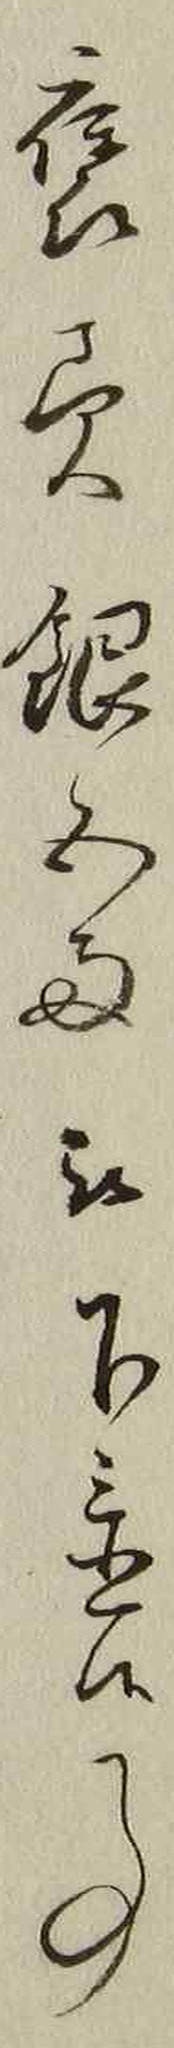褒美銀五両被下置候事
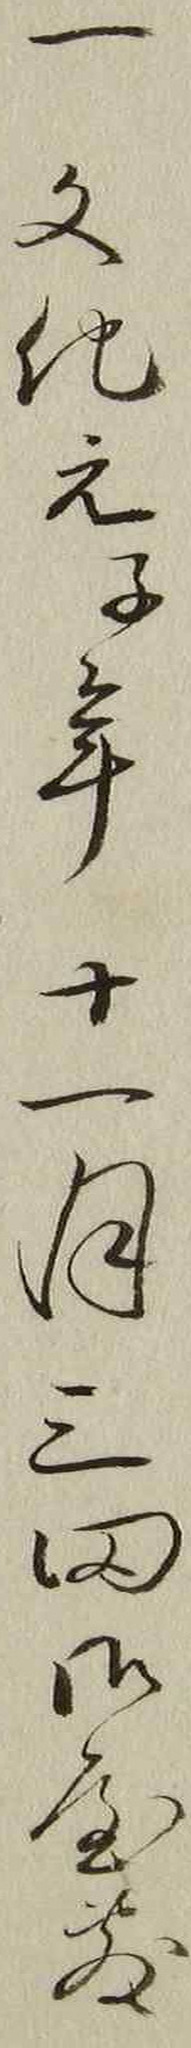一文化元子年十一月三田御屋敷
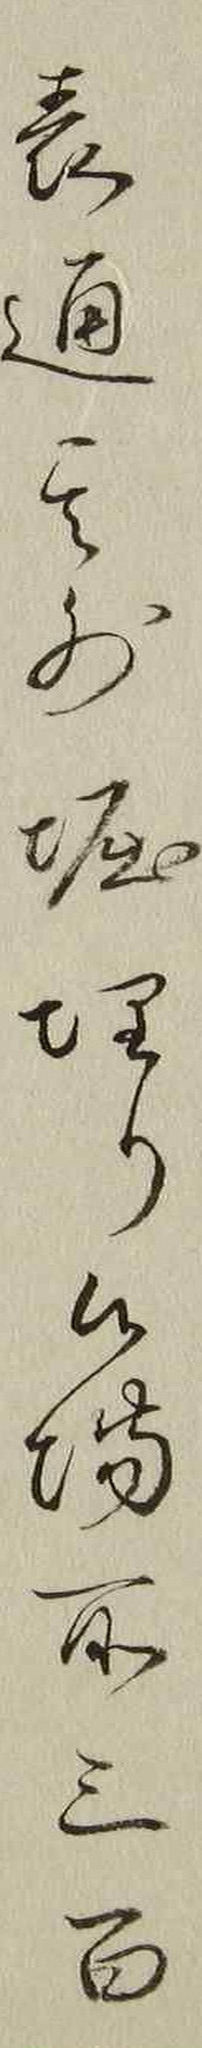表通其外堀埋り候場所三百
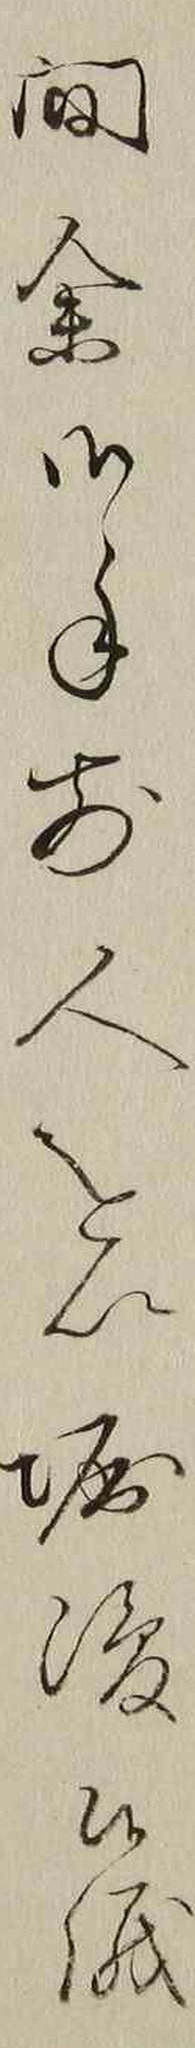間余御手前人を以堀浚候儀
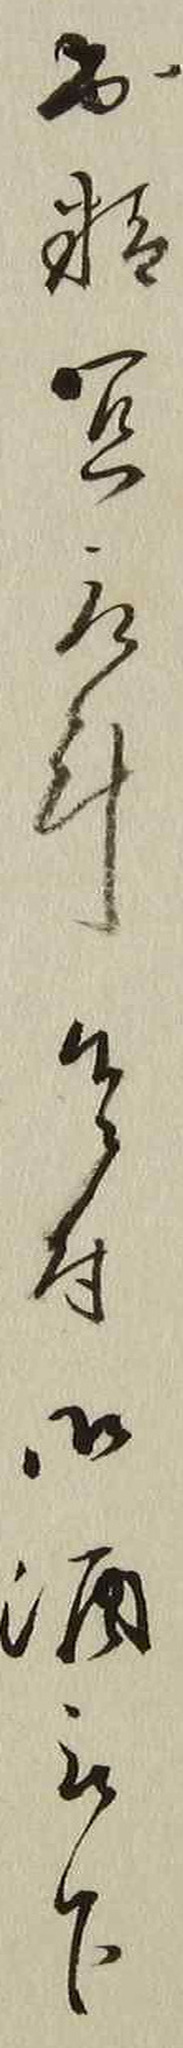出精宜取計候ニ付御酒被下
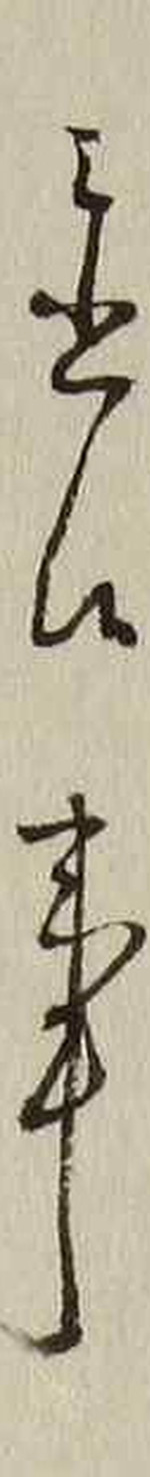置候事
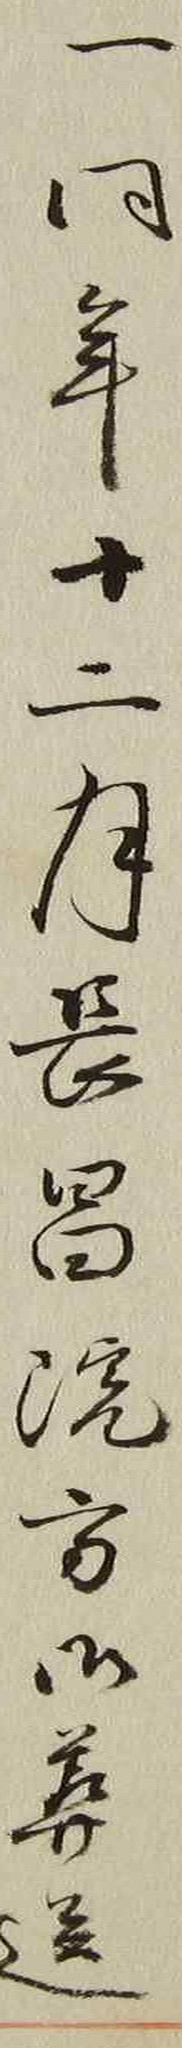一同年十二月長昌院方御葬送
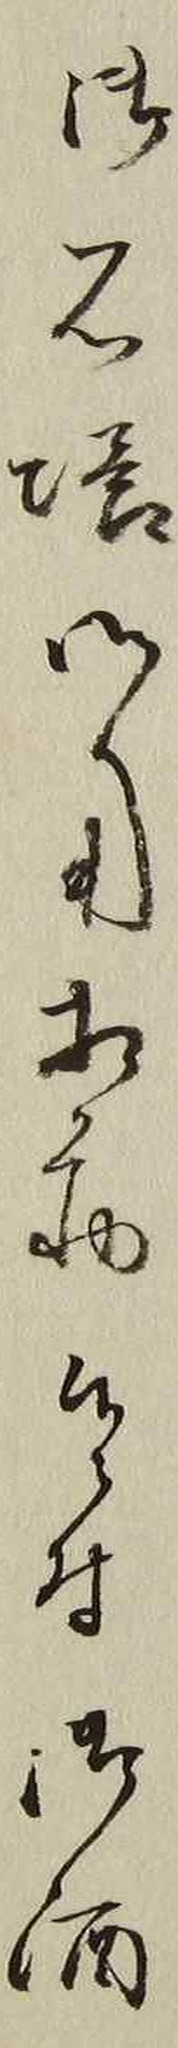御石塔御用相勤候ニ付御酒
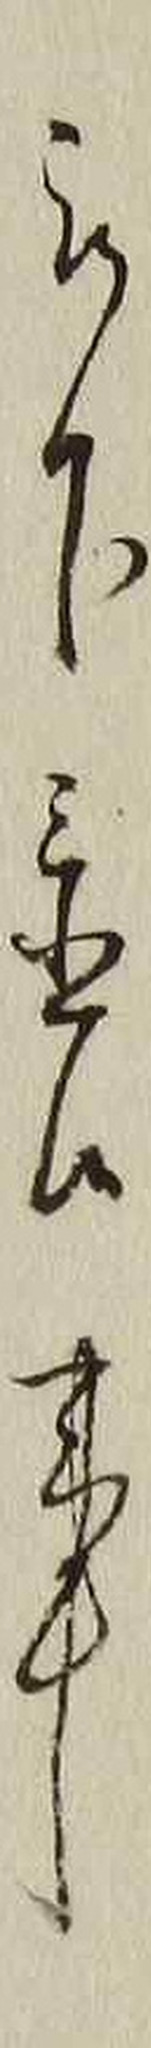被下置候事
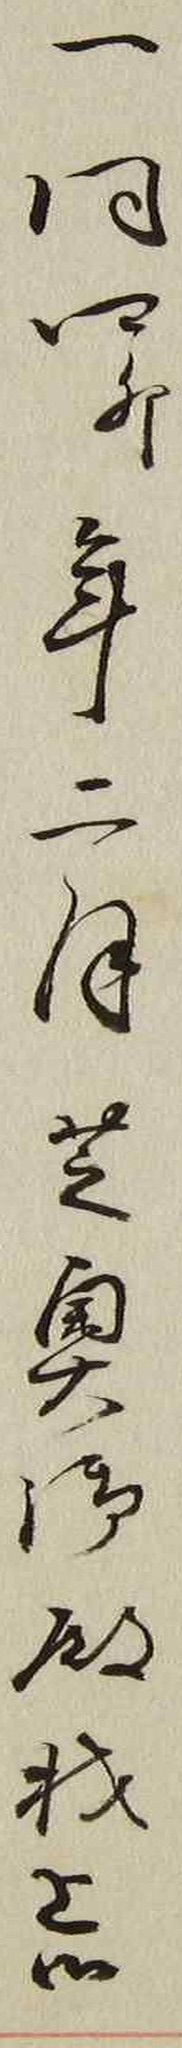一同四卯年二月芝奥御殿材木御
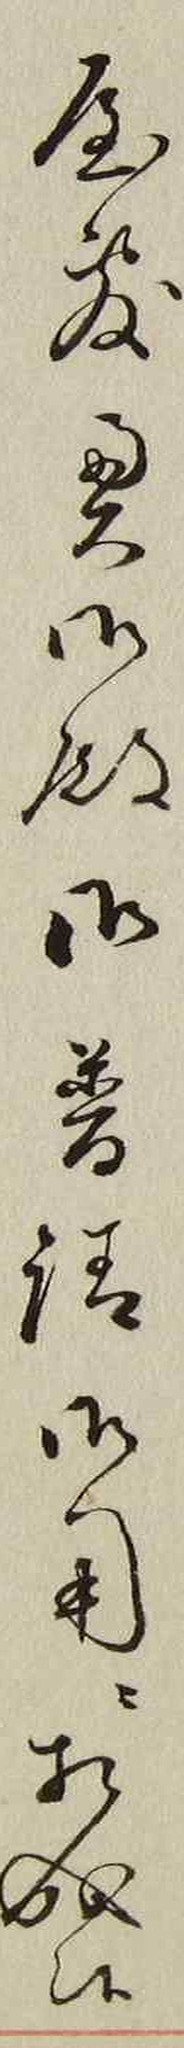屋敷奥御殿御普請御用ニ相成候
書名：諸士系譜　巻之8　い之部8
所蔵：会津若松市立会津図書館
